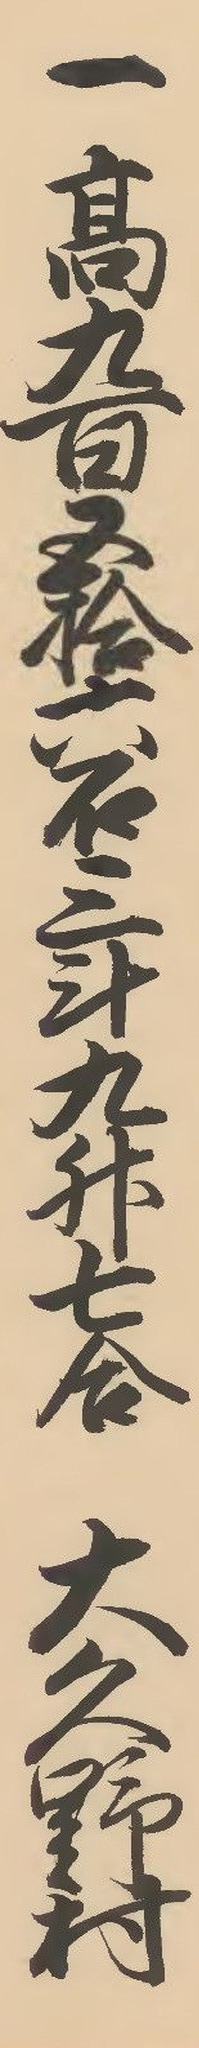一高九百五拾六石三斗九升七合大久野村

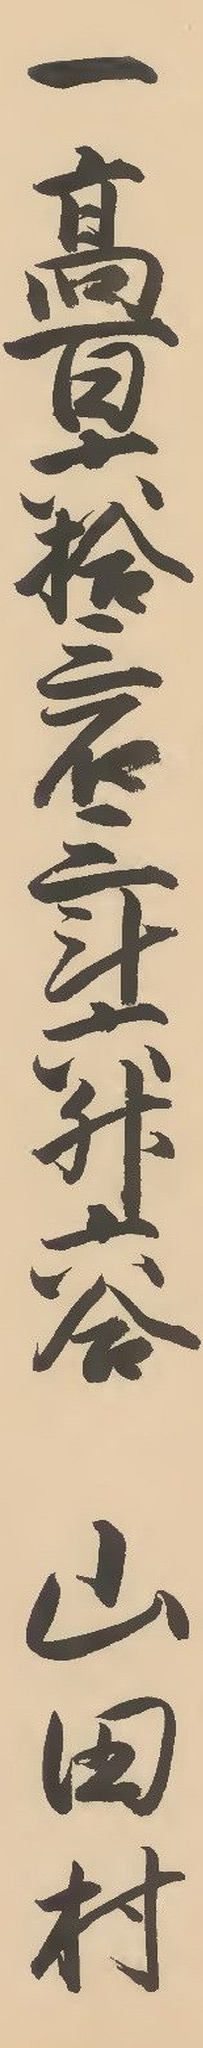一高百六拾三石三斗六升六合山田村
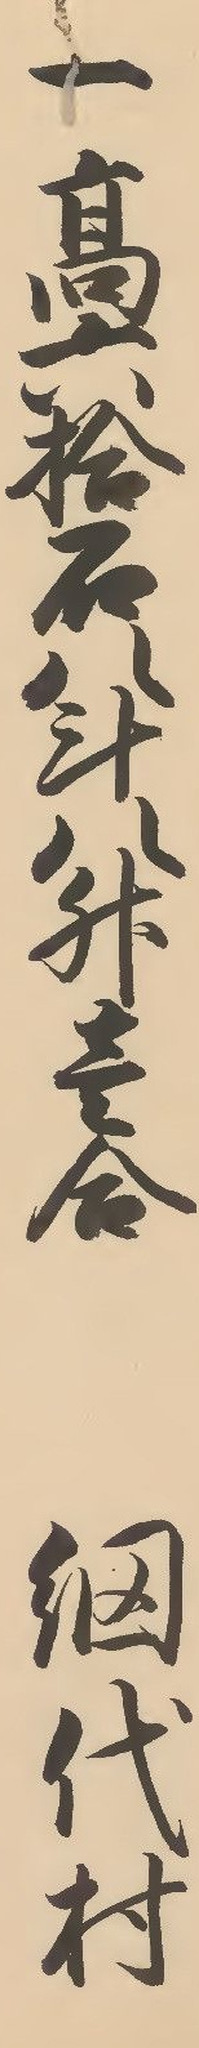一高六拾石八斗八升壱合網代村
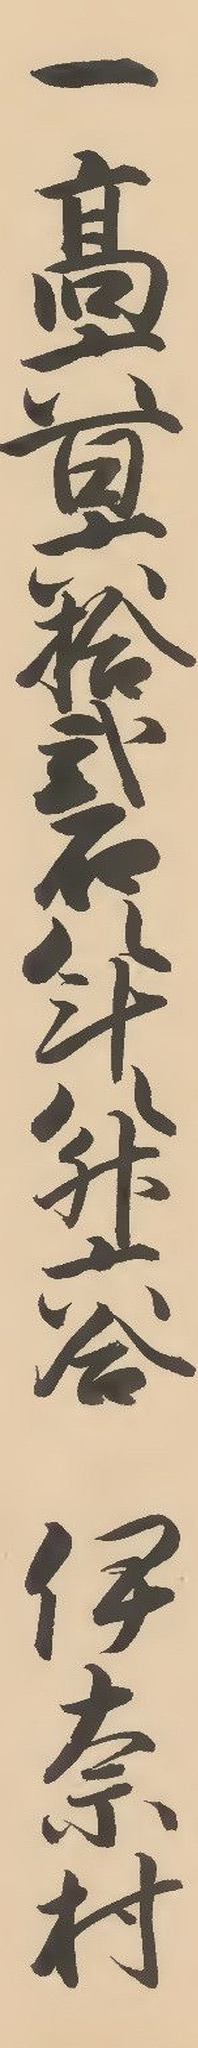一高六百六拾弐石八斗八升六合伊奈村
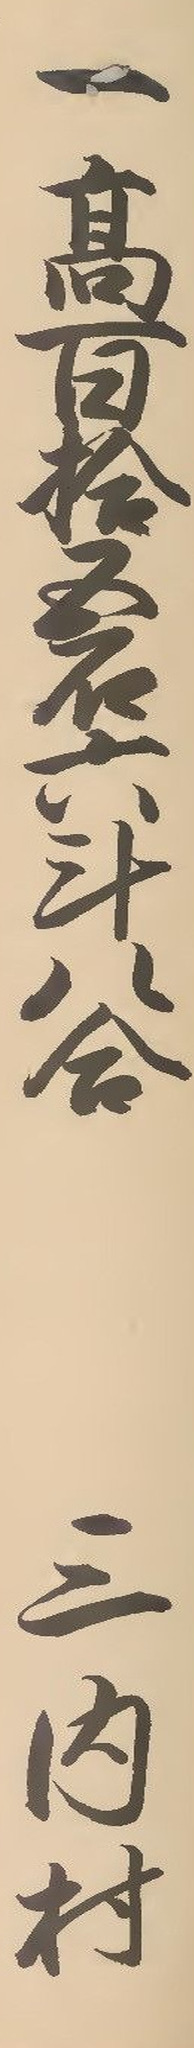一高百拾五石六斗八合三内村
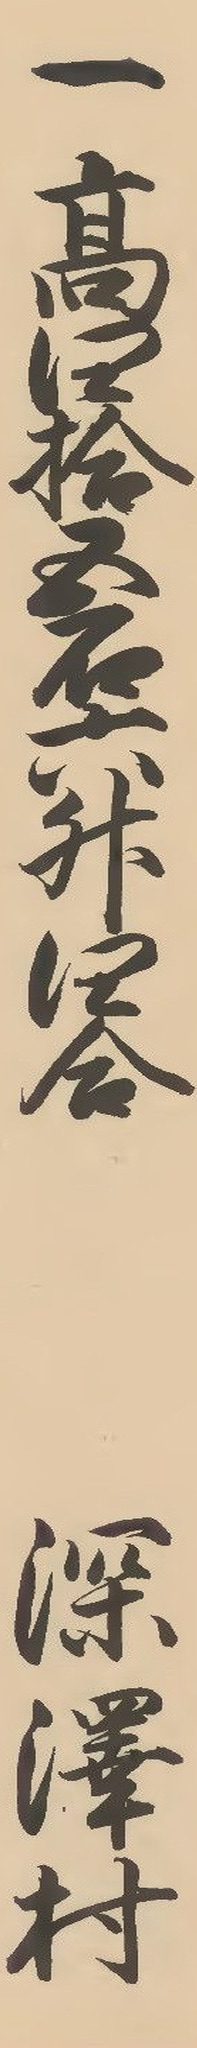一高四拾五石六升四合深澤村
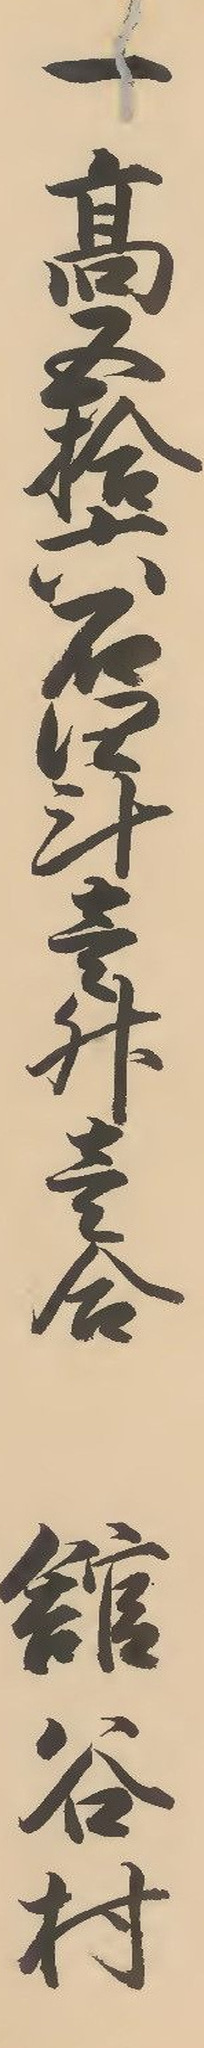一高五拾六石四斗壱升壱合館谷村
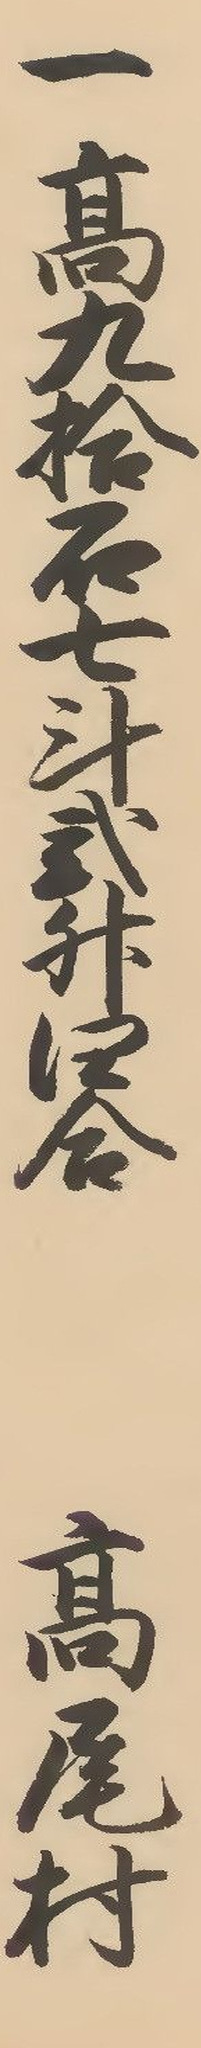一高九拾石七斗弐升四合高尾村

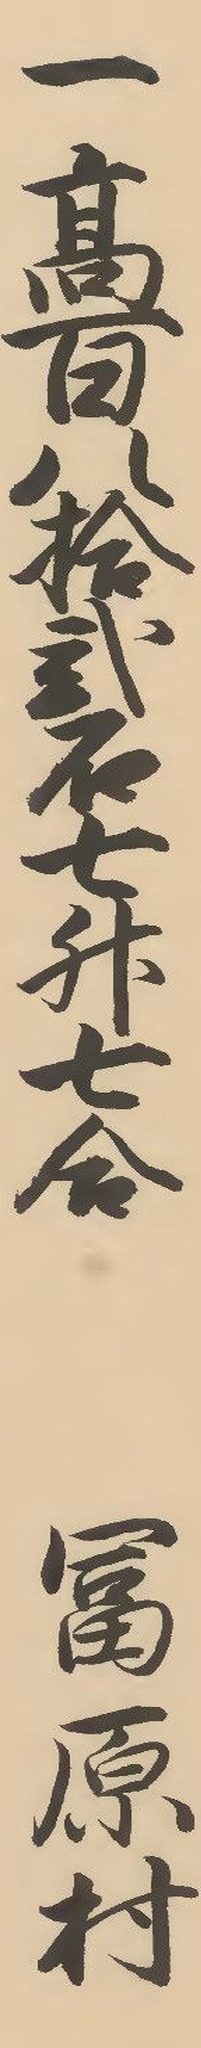一高百八拾弐石七升七合冨原村
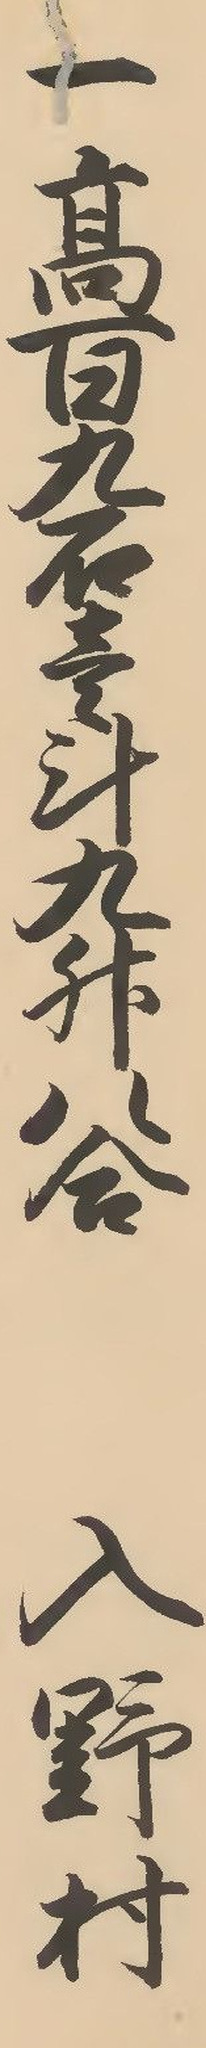一高百九石壱斗九升八合入野村
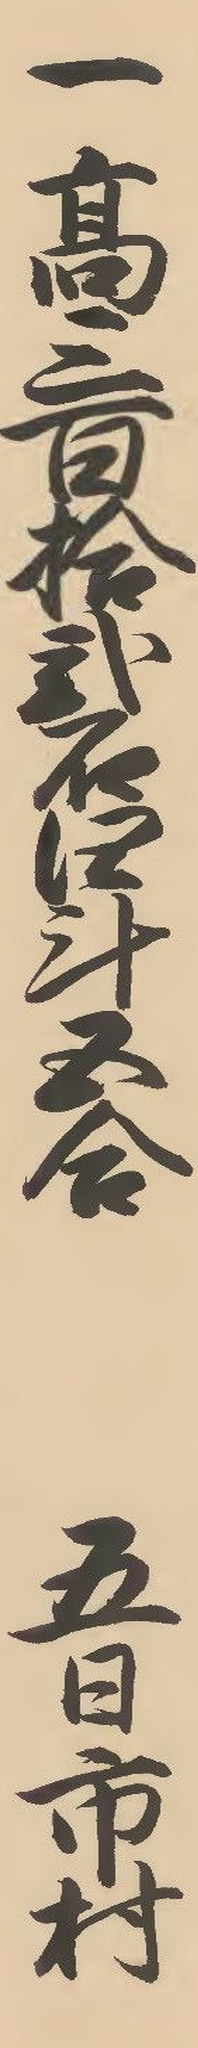一高三百拾弐石四斗五合五日市村
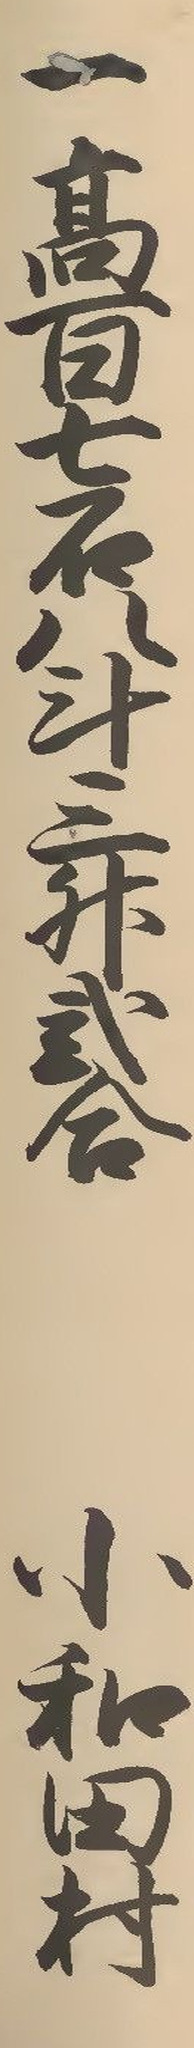一高百七石八斗三升弐合小和田村
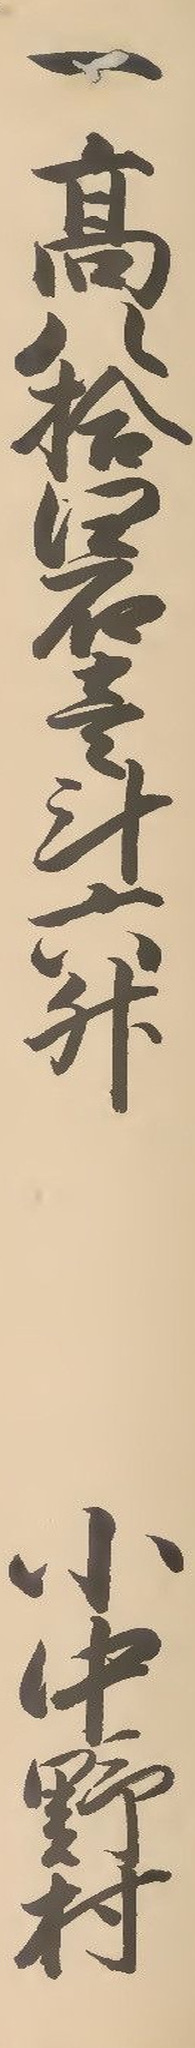一高八拾四石壱斗六升小中野村
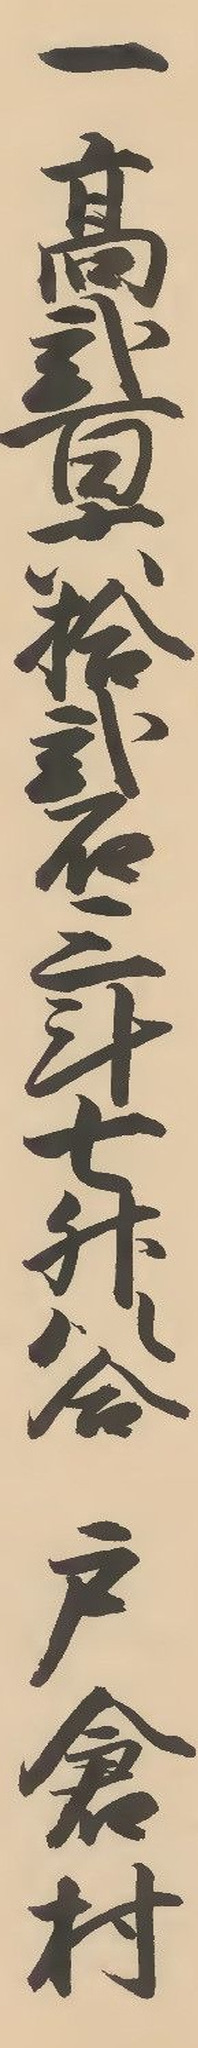一高弐百六拾弐石三斗七升八合戸倉村
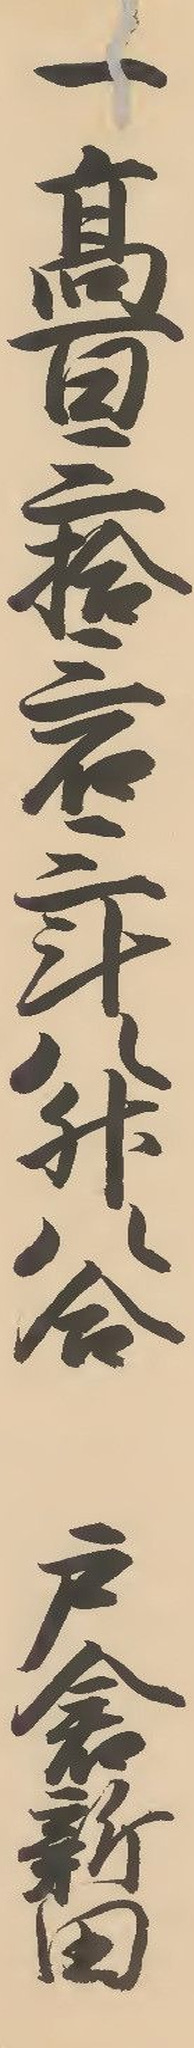一高百三拾三石三斗八升八合戸倉新田

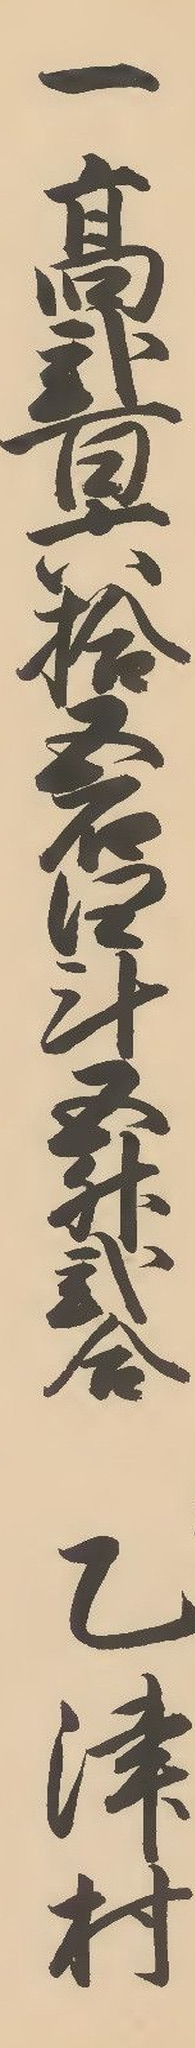一高弐百六拾五石四斗五升弐合乙津村
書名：武蔵国郷帳　上
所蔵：国立公文書館 National Archives of Japan
